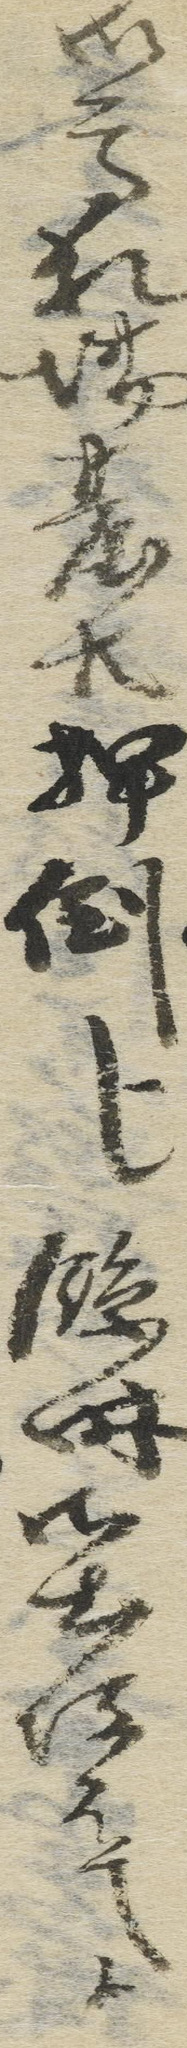御高札場台共押倒申候臨時御出役有之候
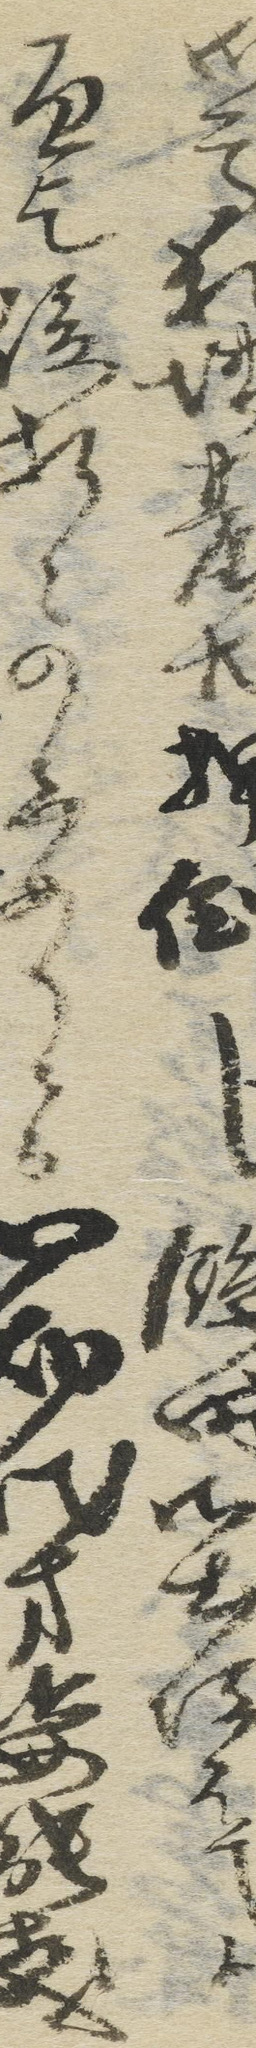雨乞後折々のしめり二而田畑作方姿能相成
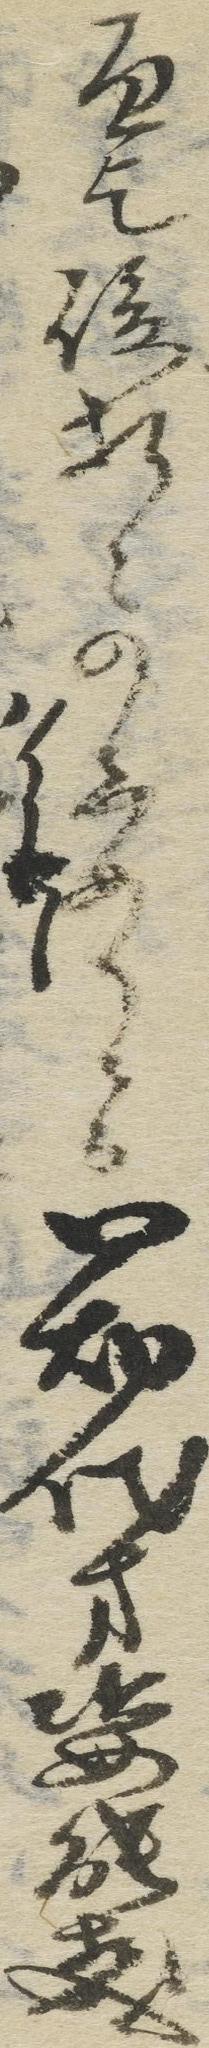雨乞後折々のしめり二而田畑作方姿能相成
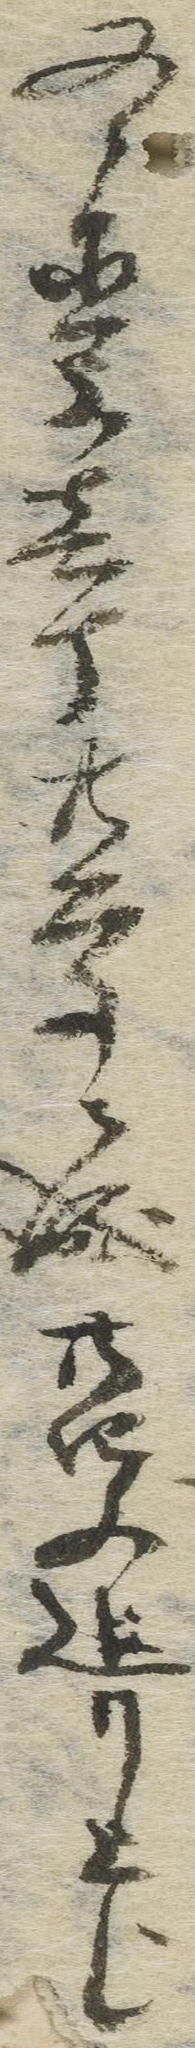又々品高壱丁廿二文二成廿四文迄引上申候
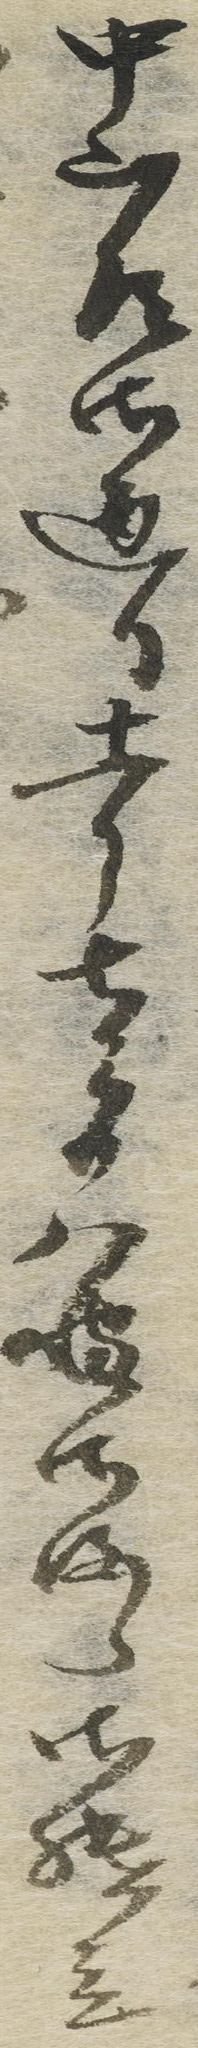中山道御通り十一月七日八幡御泊り御継立
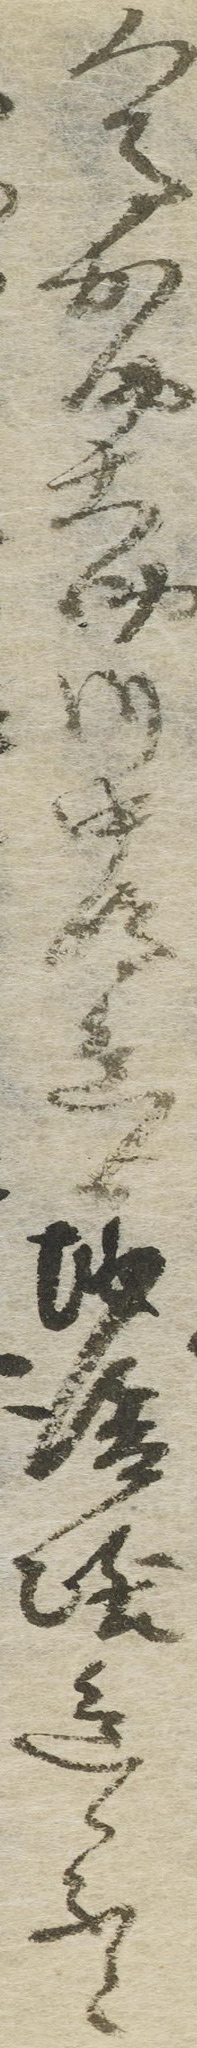人馬か助大助川中嶋辺ゟ越後湊辺参候
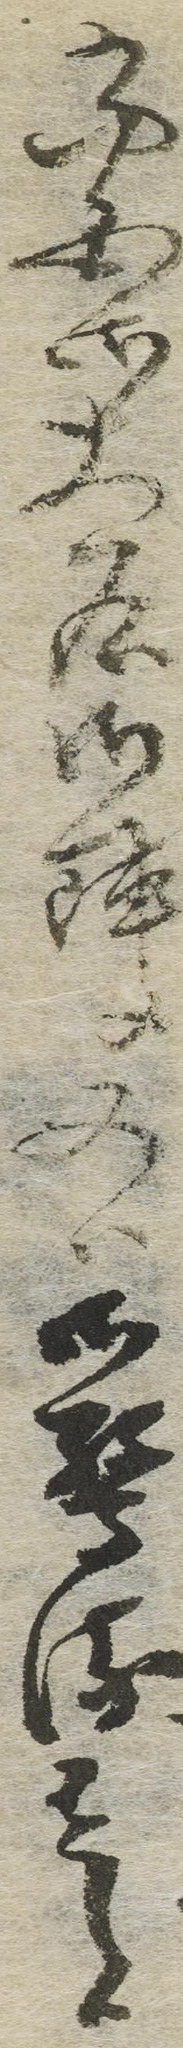当国御大名御陣〆又ハ御警衛有之候
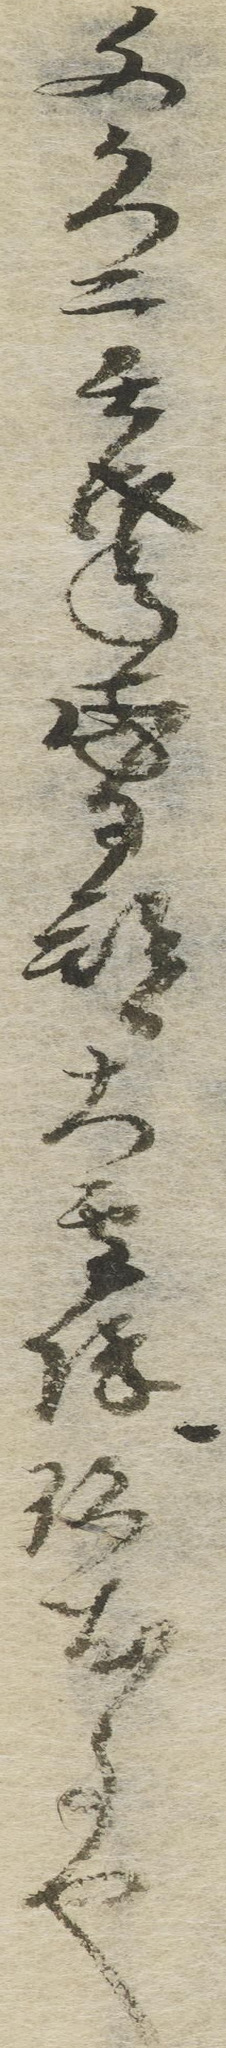文久二壬戌年霜月朔日大雪降珍敷事也

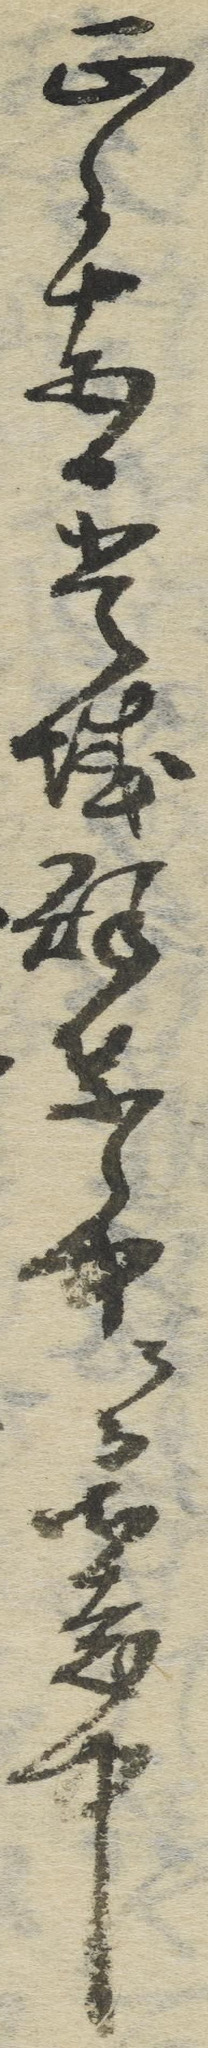正月十五日登城群集中二而御老中
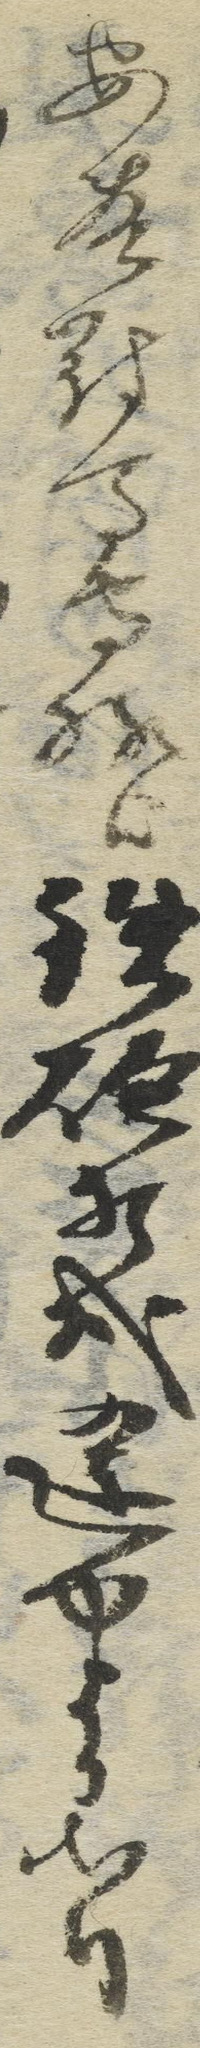安芸対馬守様江鉄砲打掛途中より御引
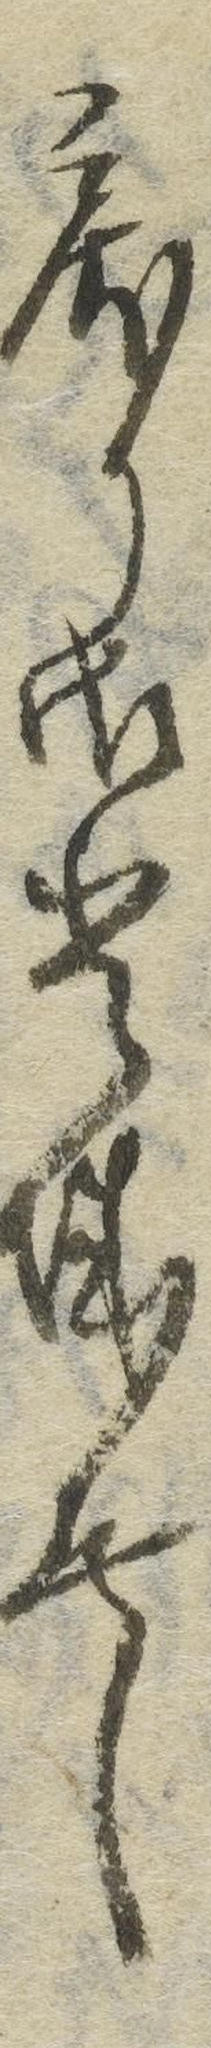戻り御登城無之
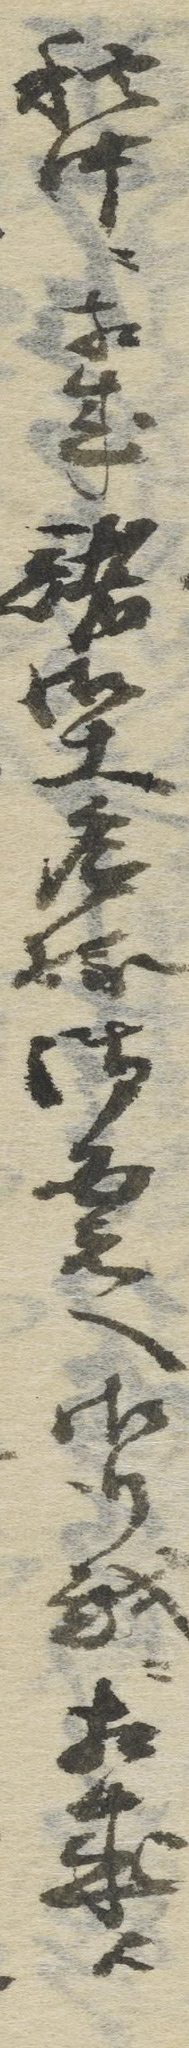秋中二相成諸御大名様御国元へ御引越二相成候
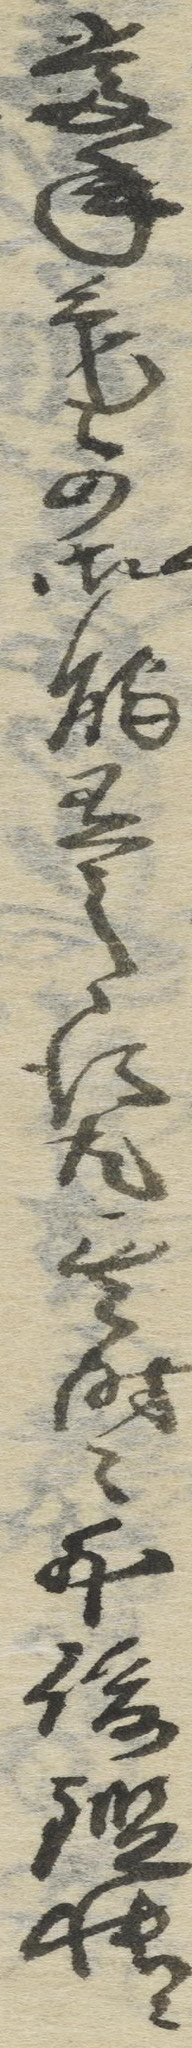当年の御触有之候得共其時々外後鑑帳二
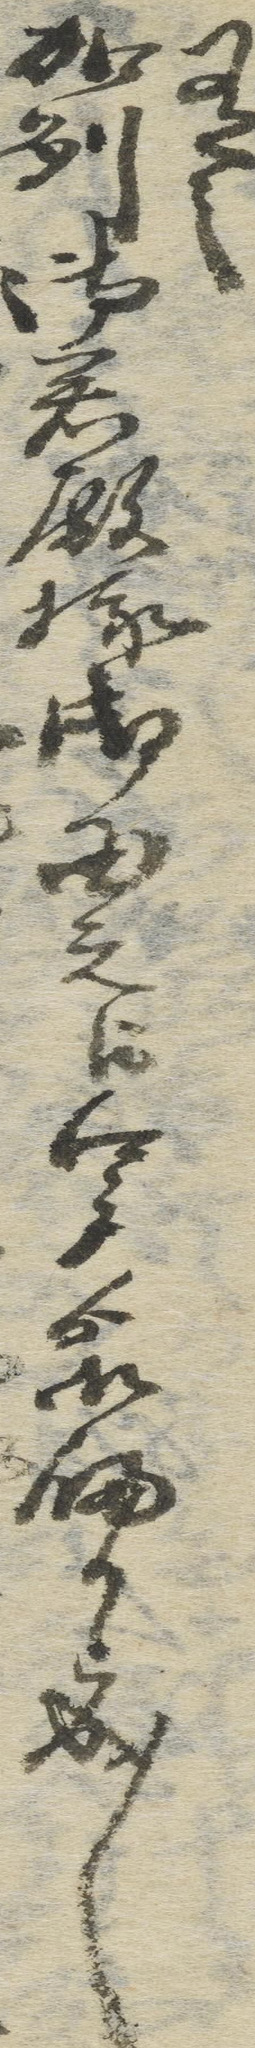加州御若殿様御国元江江戸ゟ御帰り被成候
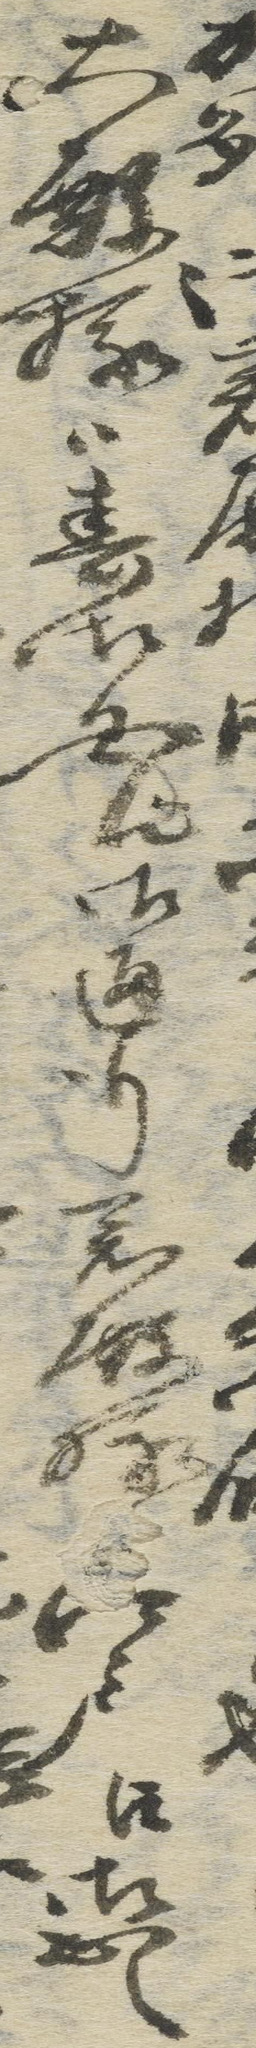大殿様ハ春御国江御通行若殿様江戸江御出
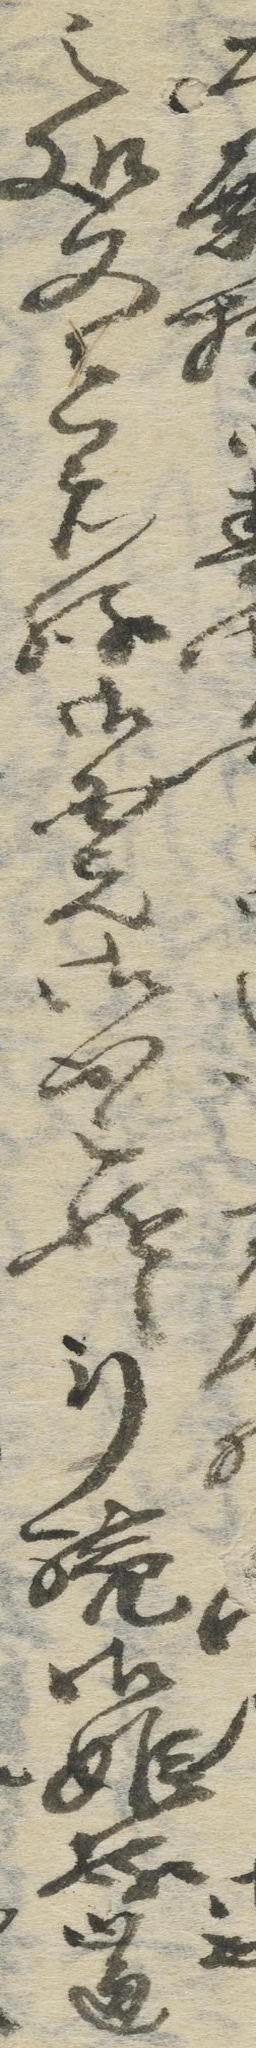之処又々御若様御国元御出被遊候引続御姫様御通
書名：信濃越後　地震書留
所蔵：東京大学地震研究所図書室 Earthquake Research Institute Library, The University of Tokyo, JAPAN
